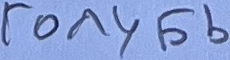голубь
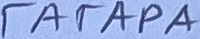гагара
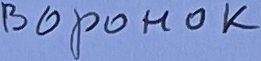воронок
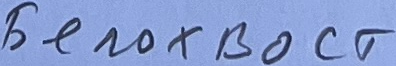белохвост
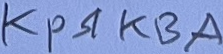кря ква
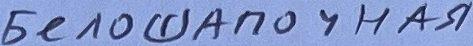белошапочная
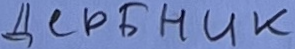дербник
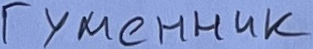гуменник
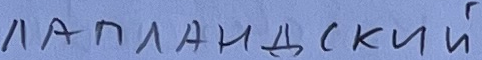лапландский
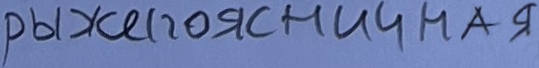рыжепоясничная
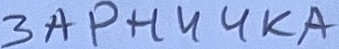зарничка
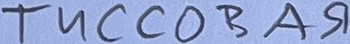тиссовая
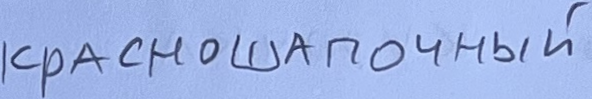красношапочный
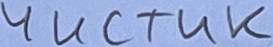чистик
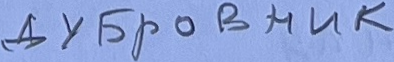дубровник
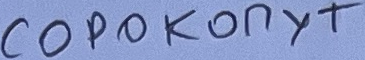сорокопут
